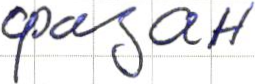фазан
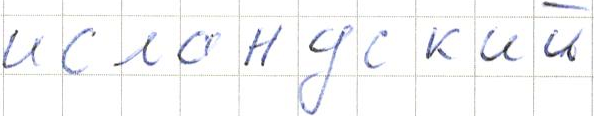исландский
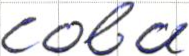сова
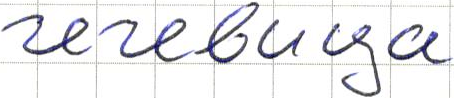чечевица
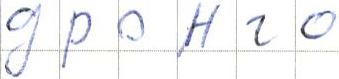дронго
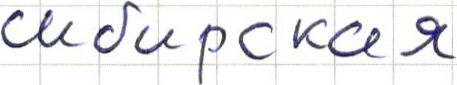сибирская
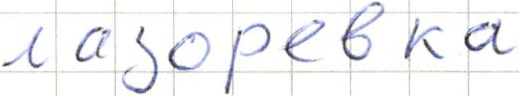лазоревка
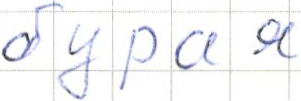бурая
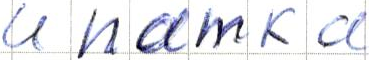ипатка
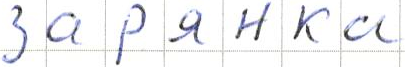зарянка
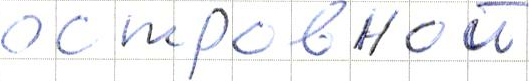островной
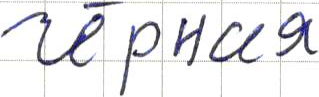чёрная
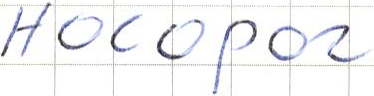носорог
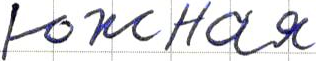южная
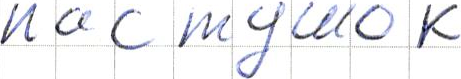пастушок
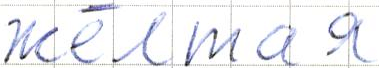жёлтая
